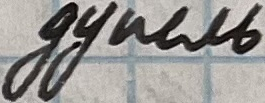дупель
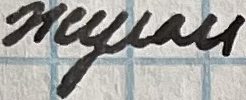жулан
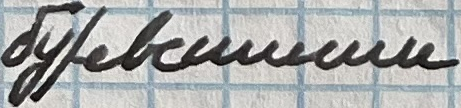буревестник
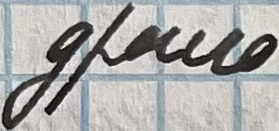дронго
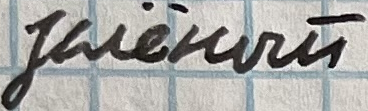зелёный
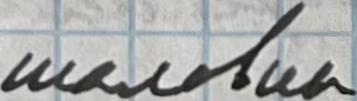таловка
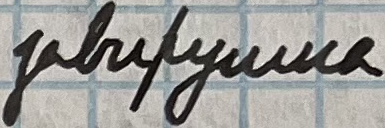завирушка
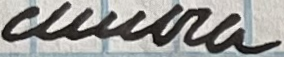синьга
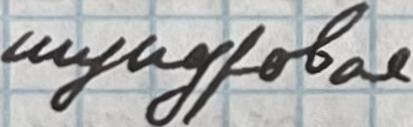тундровая
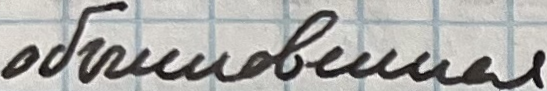обыкновенная
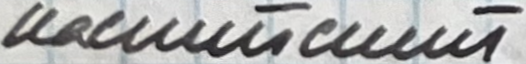каспийский
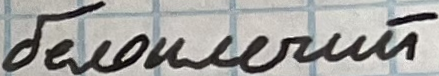белоплечий
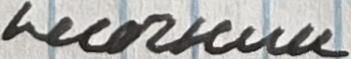песочник
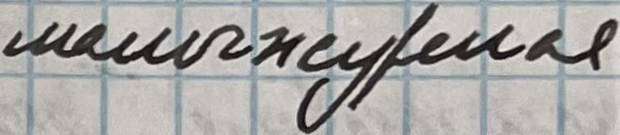маньчжурская
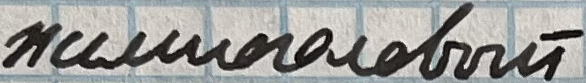желтоголовый
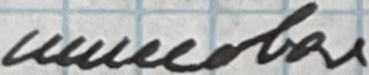тиссовая
